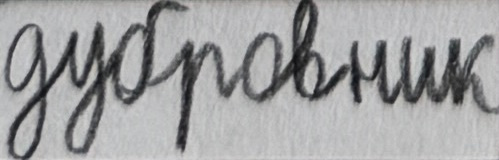дубровник
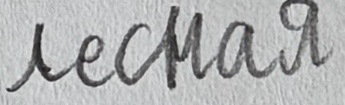лесная
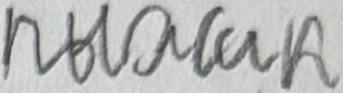пыжик
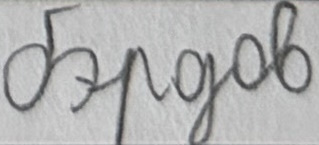бэрдов
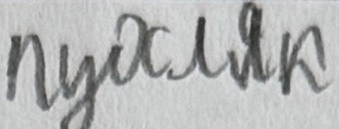пухляк
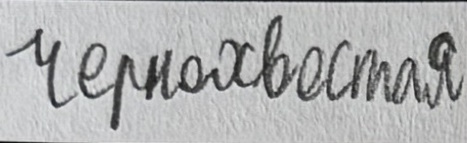чернохвостая
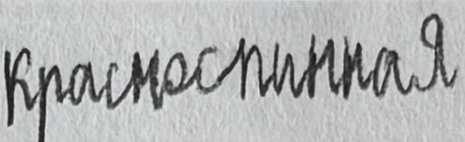красноспинная
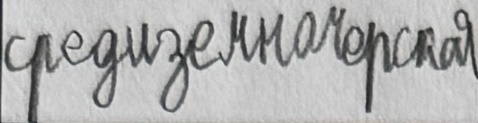средиземноморская
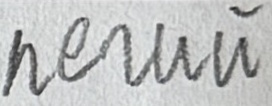пегий
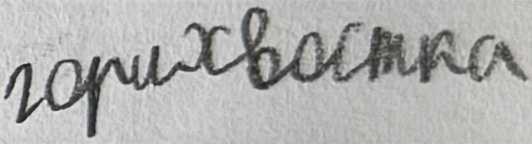горихвостка
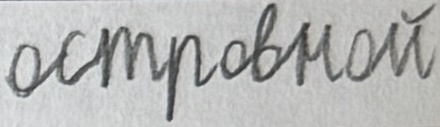островной
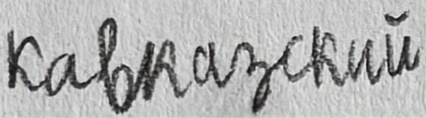кавказский
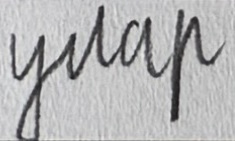улар
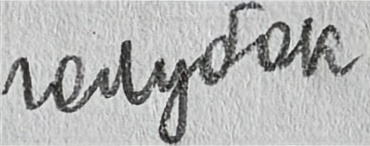голубок
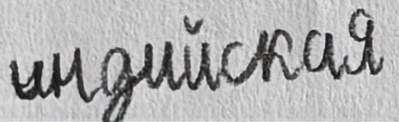индийская
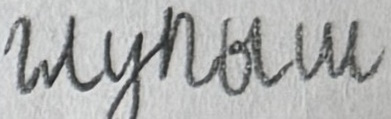глупыш
